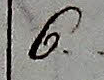6.
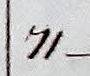71
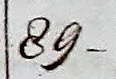89
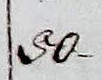50
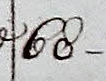68
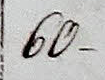60
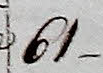61
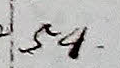54
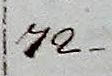72
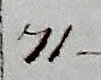71
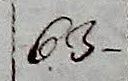63
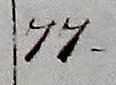77
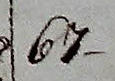67
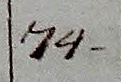74
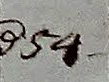54
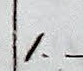1.
